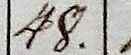48.
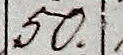50.
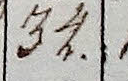34.
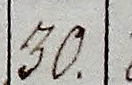30.
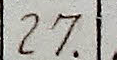27.
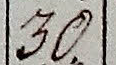30.
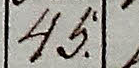45.
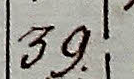39.
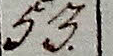53.
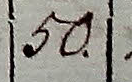50.
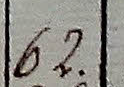62.
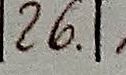26.
